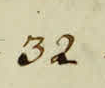32
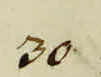30
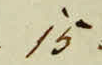15
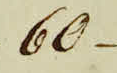60
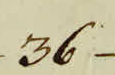36
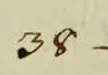38
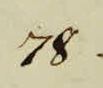78
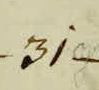31
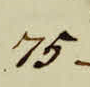75
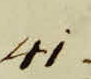41
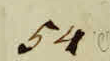54
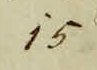12
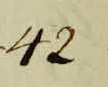42
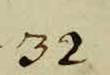32
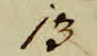13
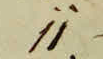11
